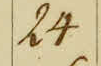24
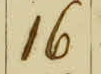16
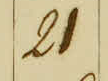21
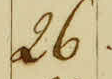26
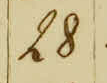28
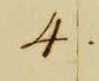4
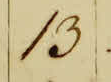13
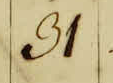31
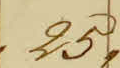25
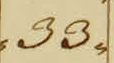33
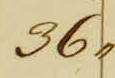36
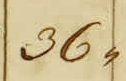36
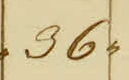36
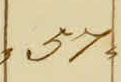57
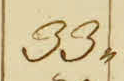33
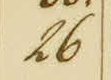26
